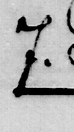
1.)
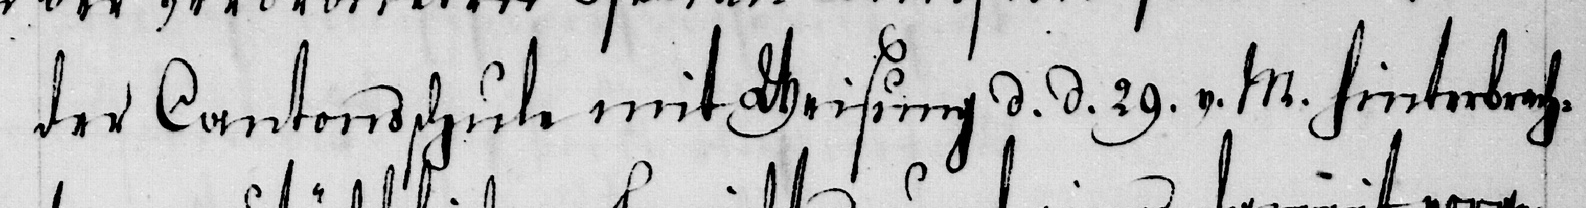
der Cantonsschule mit Weisung d. d. 29. v. M. hinterbrac¬
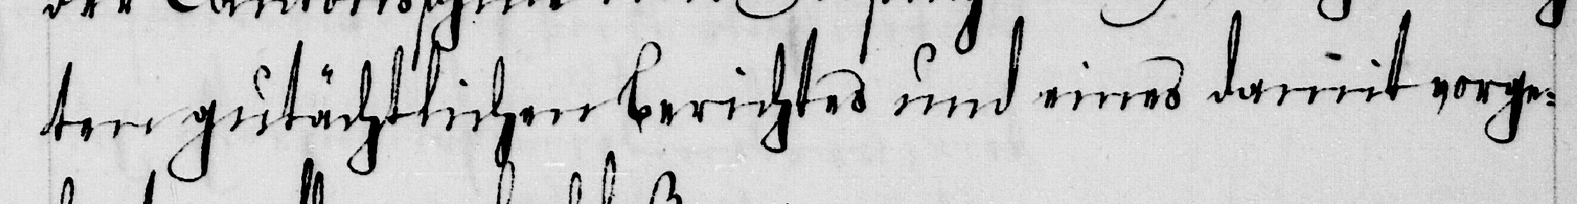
hten gutächtlichen Berichtes und eines damit vorge¬
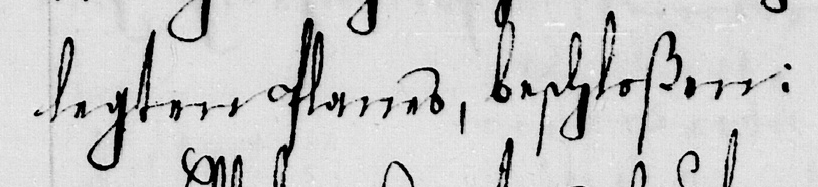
legten Planes, beschloßen:
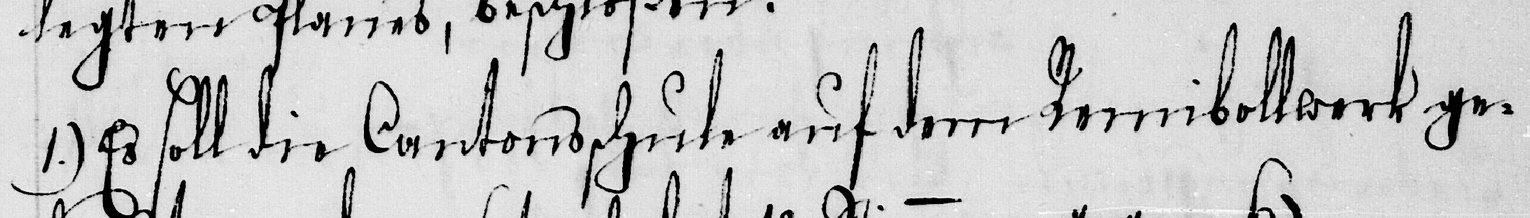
Es soll die Cantonsschule auf dem Remibollwerk ge¬
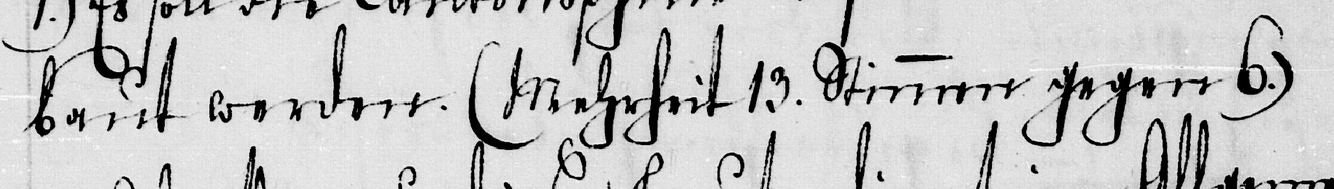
baut werden. (Mehrheit 13. Stimmen gegen 6.)
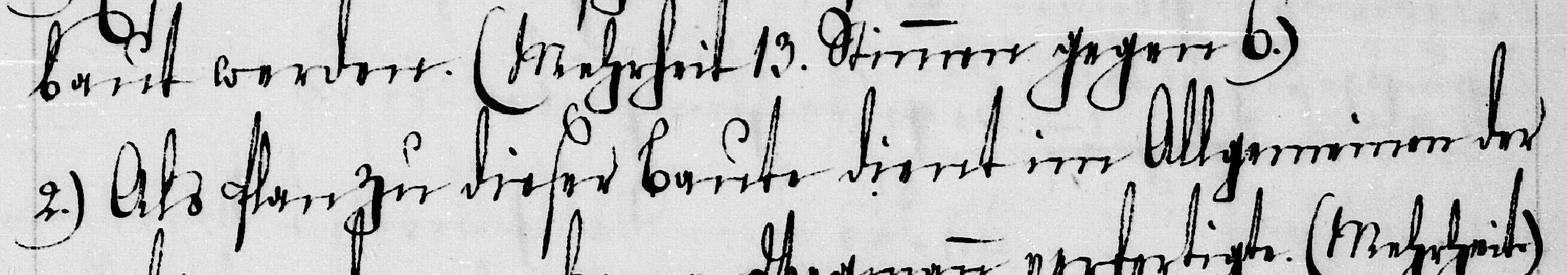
2.) Als Plan zu dieser Baute dient im Allgemeinen der
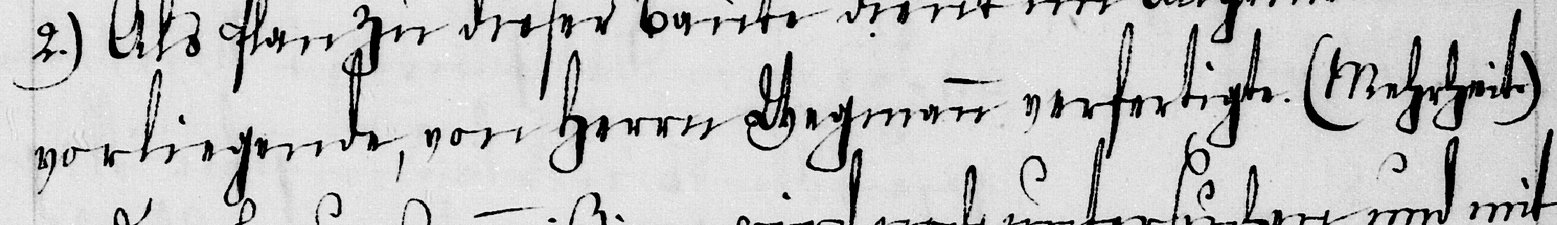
vorliegende, von Herrn Wegmann verfertigte. (Mehrheit)
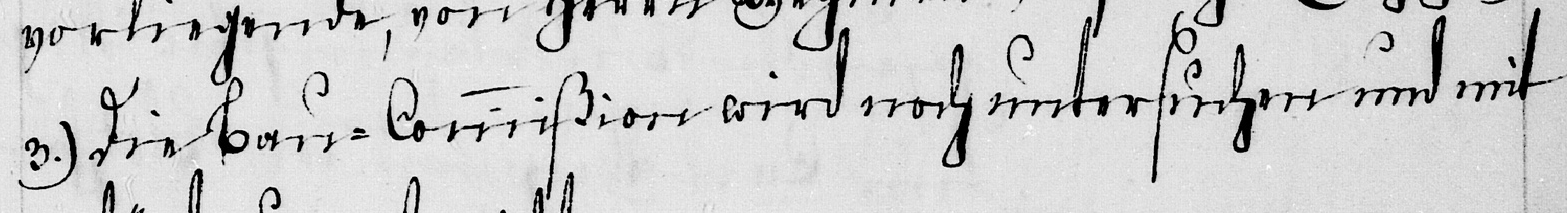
3.) Die Bau-Commißion wird noch untersuchen und mit
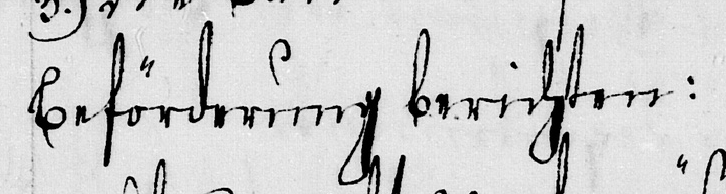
Beförderung berichten:
